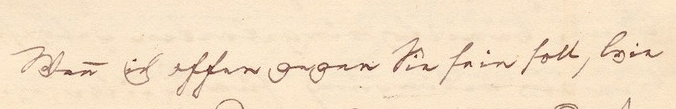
Wenn ich offen gegen Sie sein soll, wie
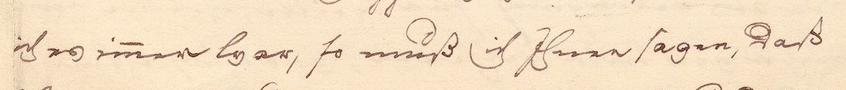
ich es immer war, so muß ich Ihnen sagen, daß
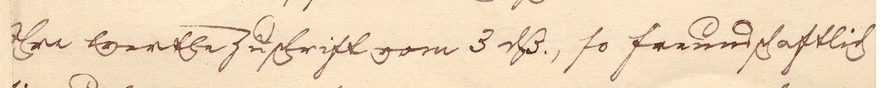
Ihre werthe Zuschrift vom 3 dß., so freundschaftlich
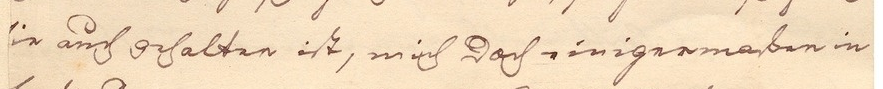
sie auch gehalten ist, mich doch einigermaßen in
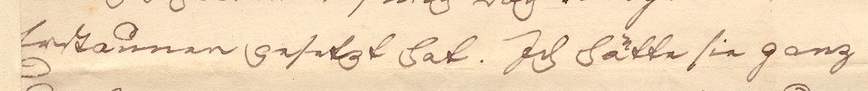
Erstaunen gesetzt hat. Ich hätte sie ganz
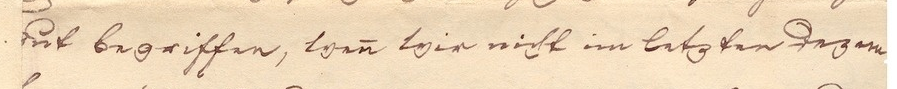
gut begriffen, wenn wir nicht im letzten Dezem-
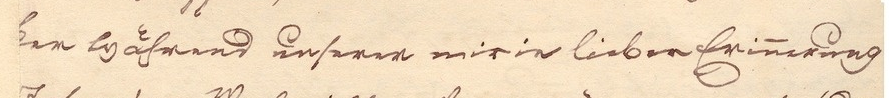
ber während unserer mir in lieber Erinnerung
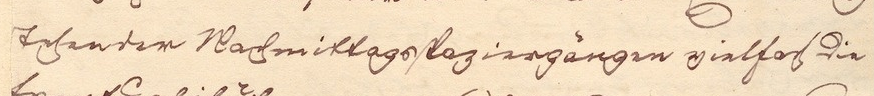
stehender Nachmittagsspaziergängen vielfach die
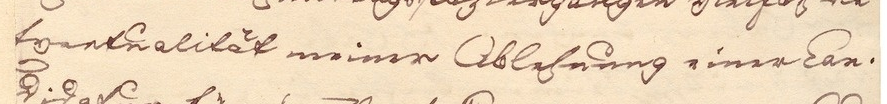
Eventualität meiner Ablehnung einer Can-
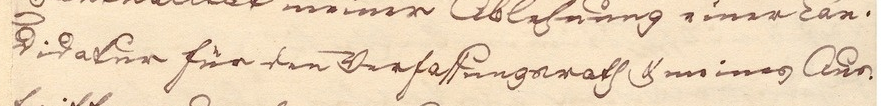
didatur für den Verfassungsrath & meines Aus-
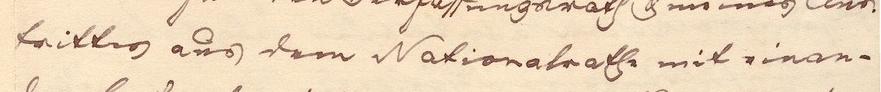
trittes aus dem Nationalrathe mit einan-
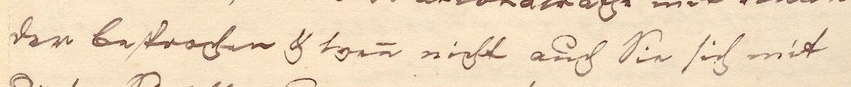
der besprochen & wenn nicht auch Sie sich mit
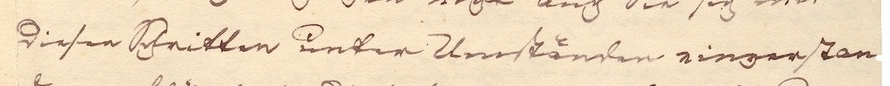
diesen Schritten unter Umständen einverstan-
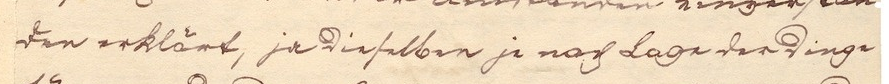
den erklärt, ja dieselben je nach Lage der Dinge
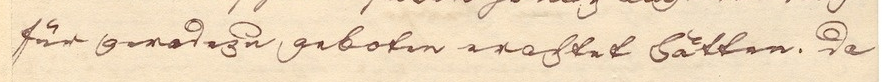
für geradezu geboten erachtet hätten. Da
